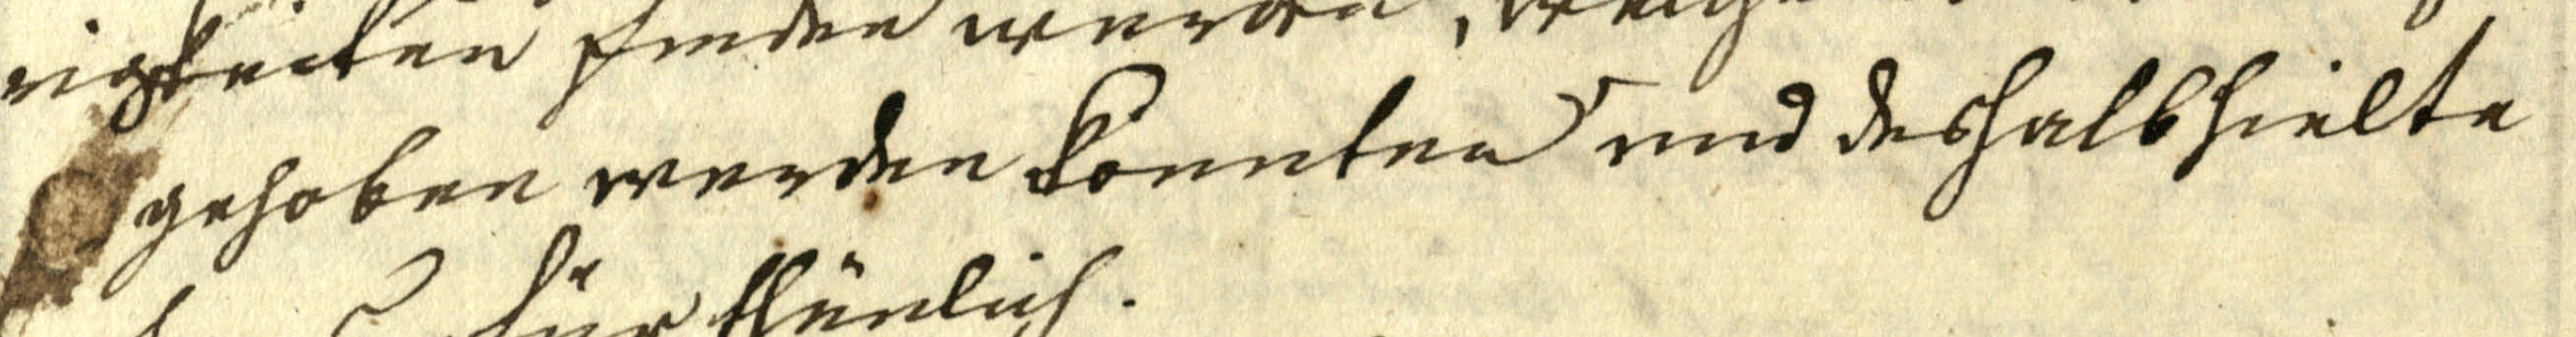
gehoben werden könnten und deshalb hielte
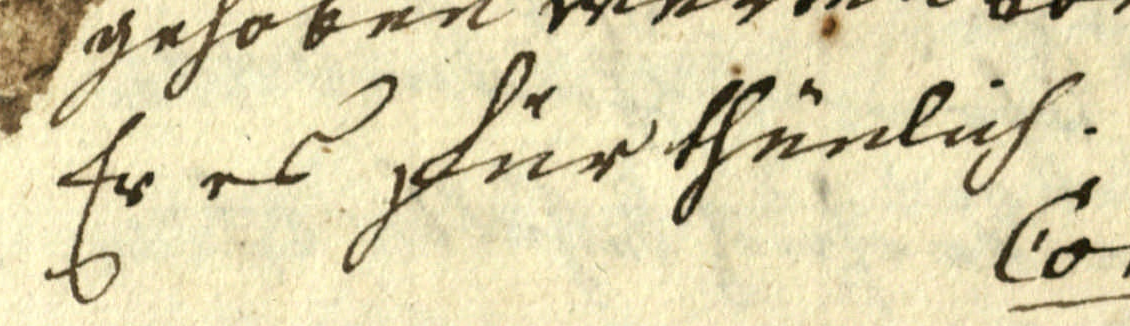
Er es für thunlich.
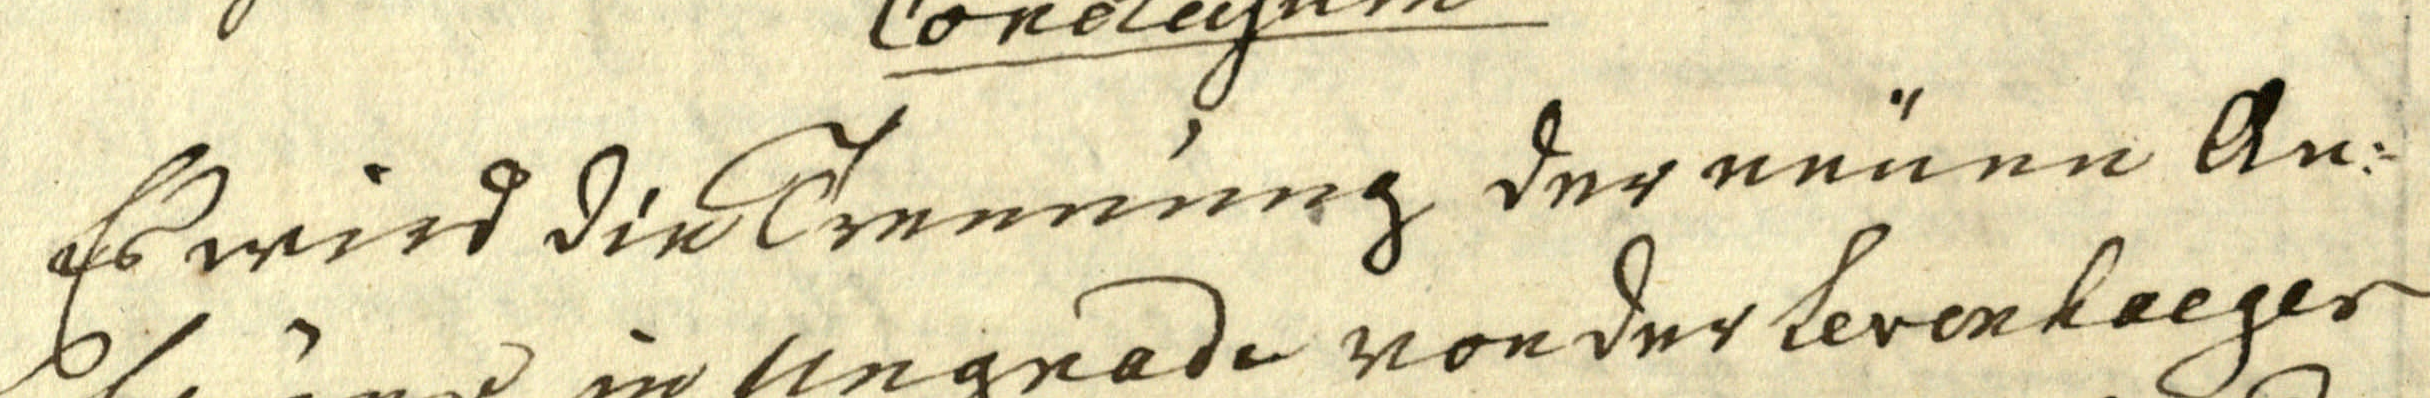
Es wird die Trennung der neuen An¬
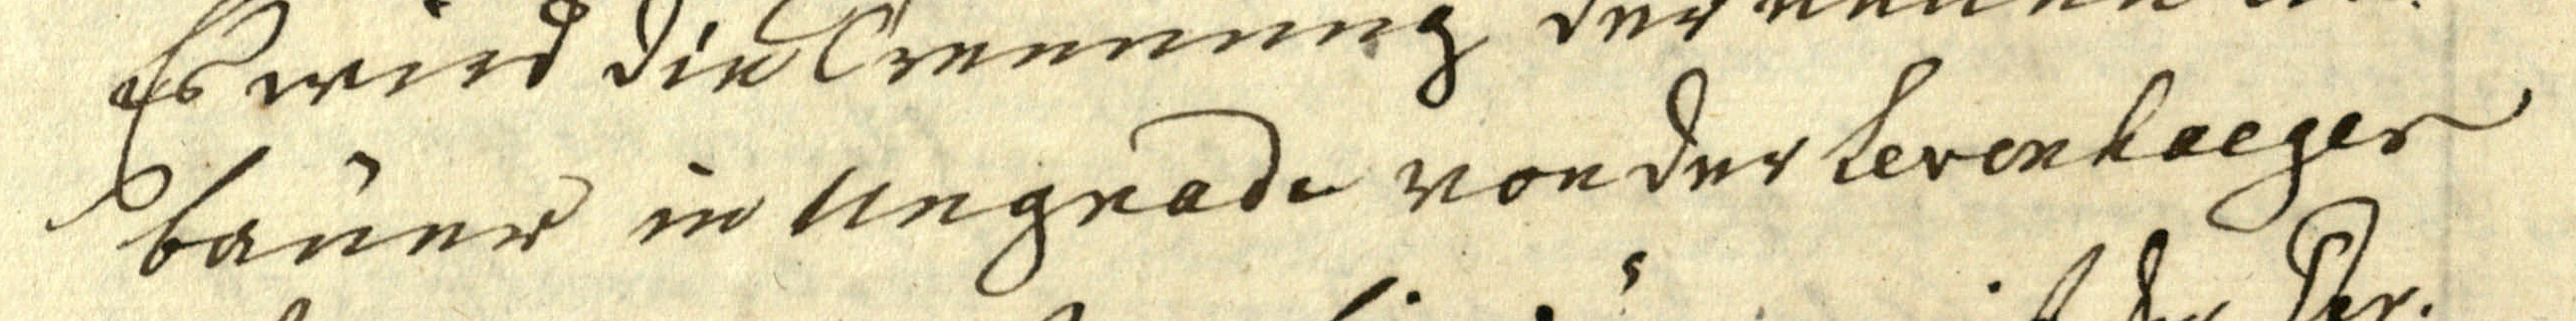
bauer in Ungnade von der Levenhaeger
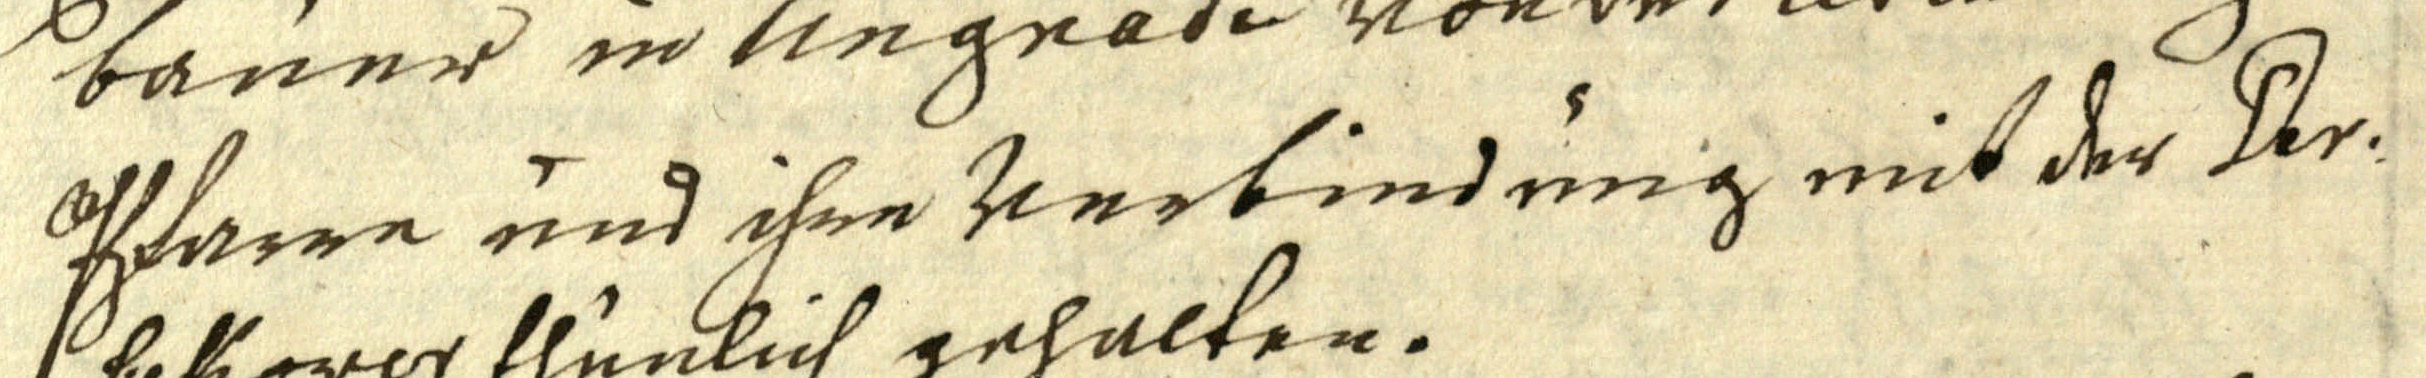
Pfarre und ihre Verbindung mit der Der¬
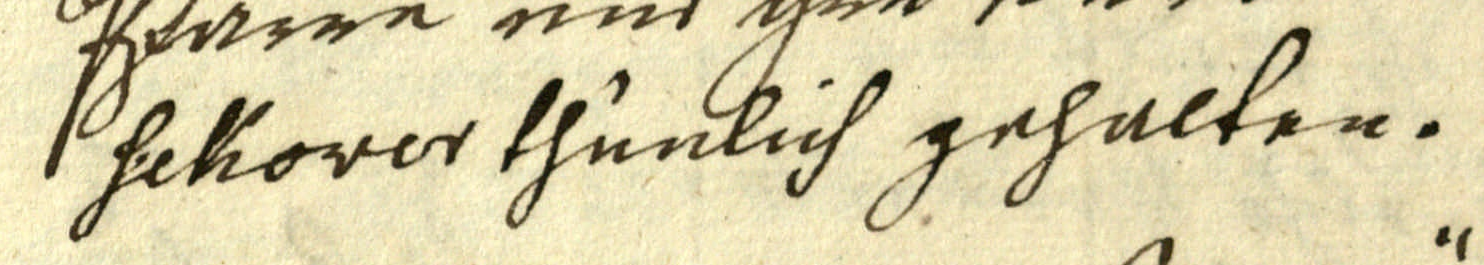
sekower thunlich gehalten.
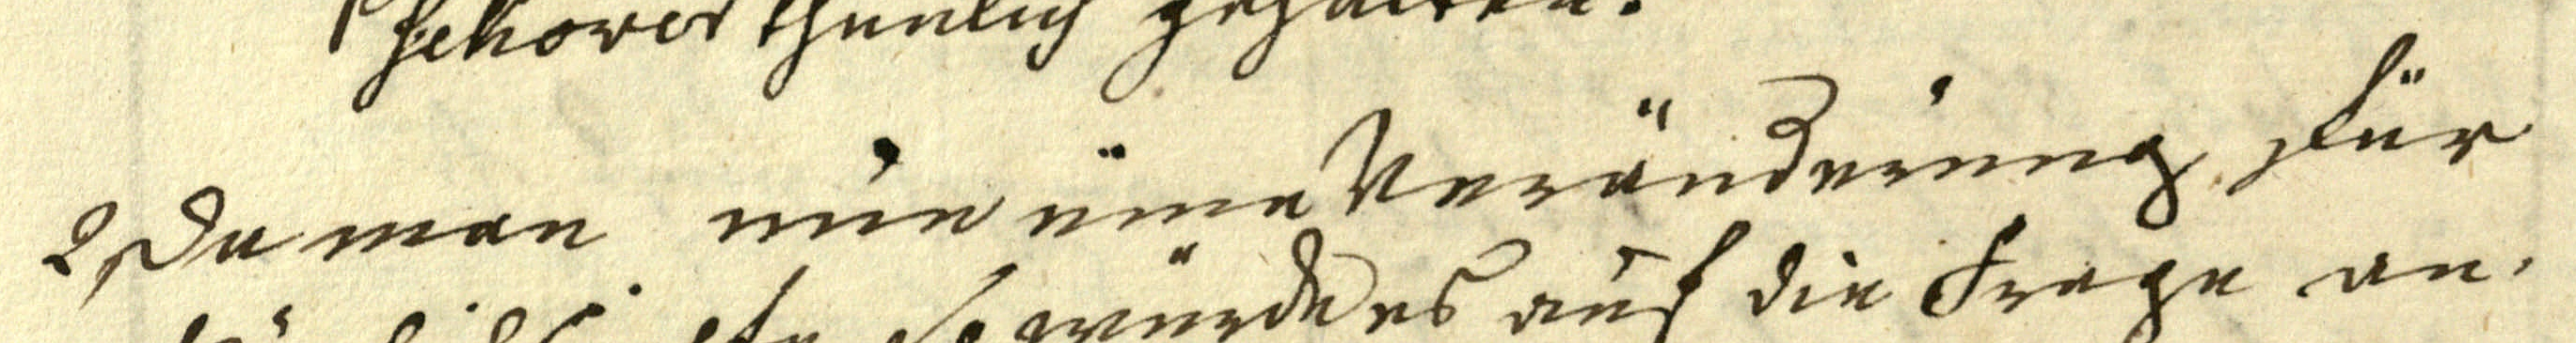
2, Da man nun eine Veränderung für
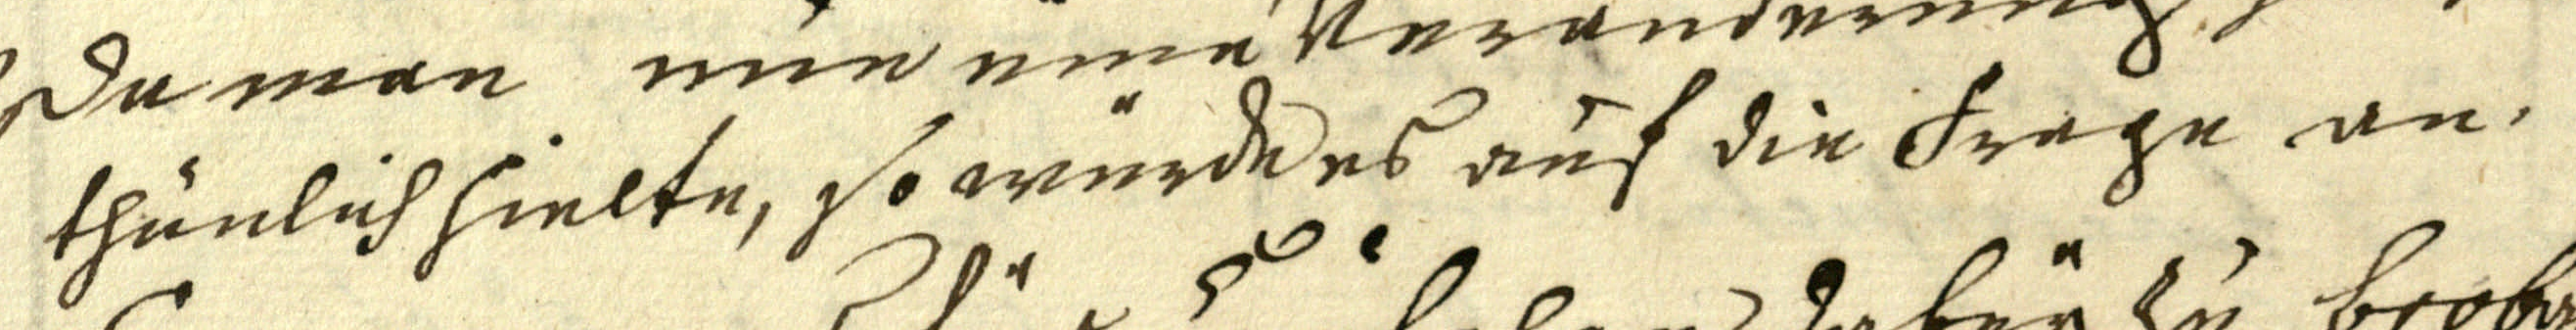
thunlich hielte, so würde es auf die Frage an¬
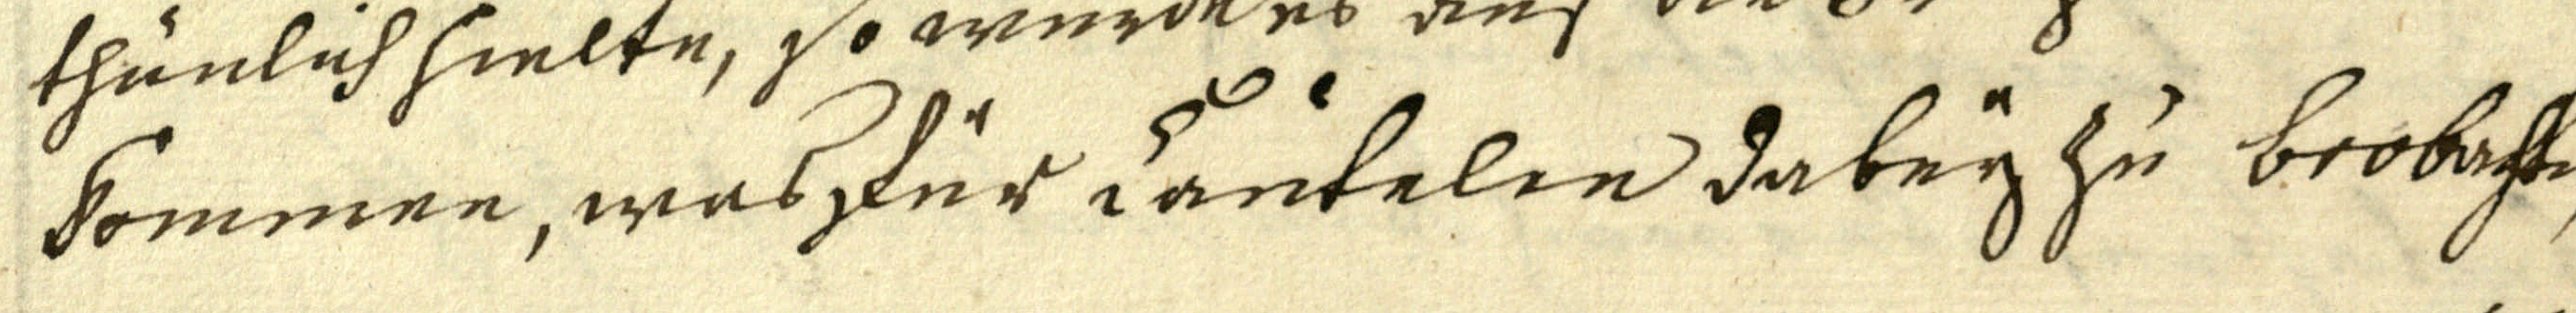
kommen, was für Kautelen dabeÿ zu beobachten
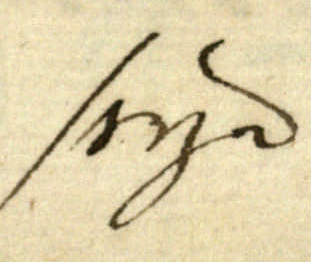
seÿn
